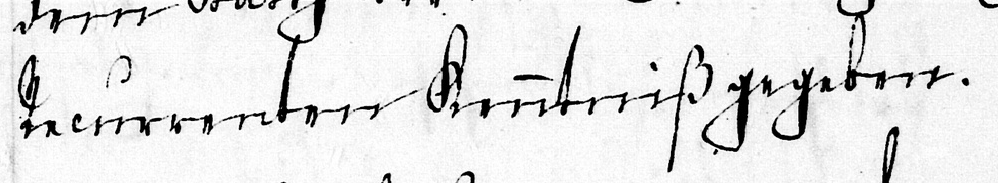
Recurrenten Kenntniß gegeben.
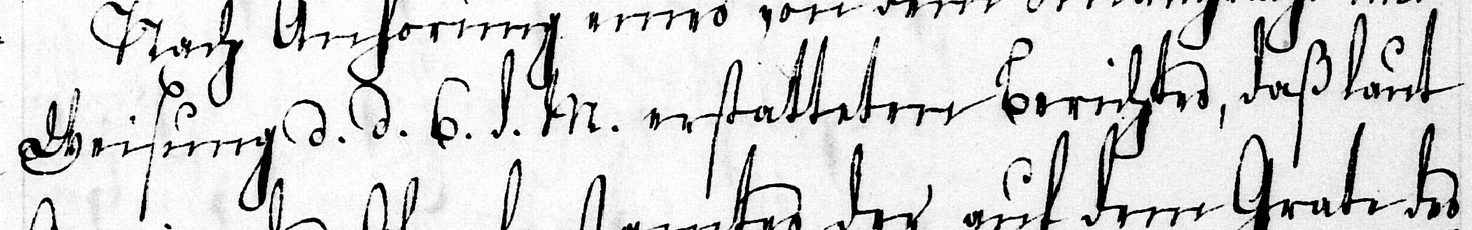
Weisung d. d. 6. d. M. erstatteten Berichtes, daß laut
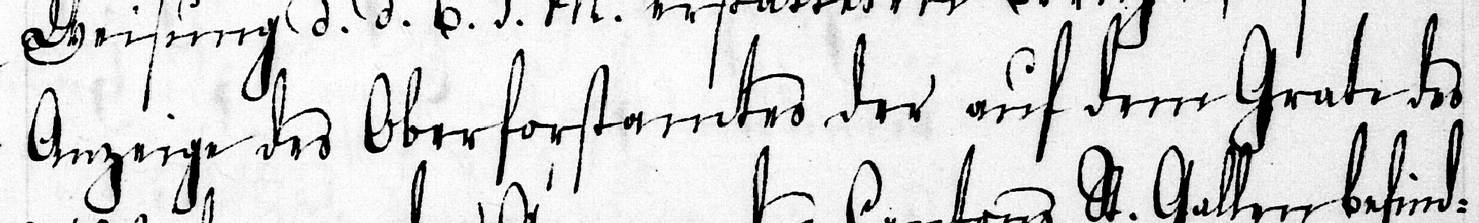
Anzeige des Oberforstamtes der auf dem Grate des
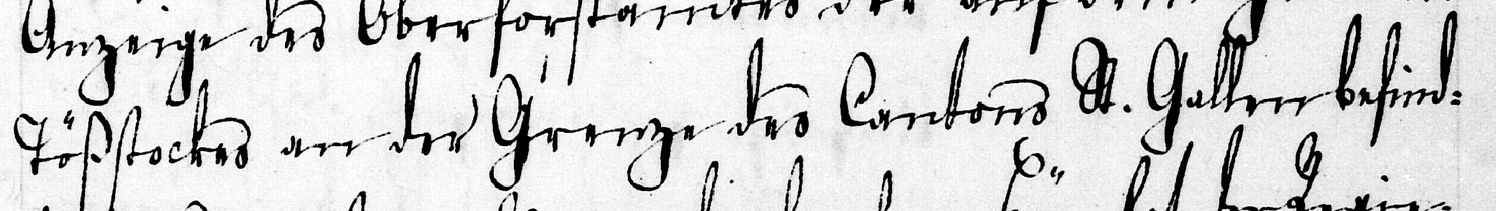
Tößstockes an der Grenze des Cantons St. Gallen befind¬
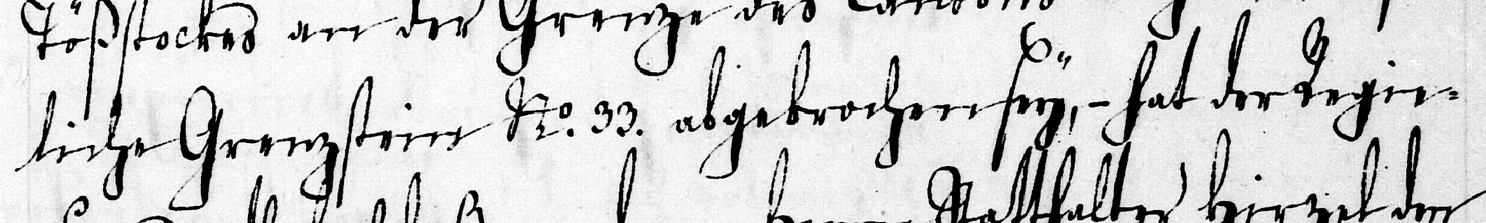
liche Grenzstein No. 33. abgebrochen sey, hat der Regie¬
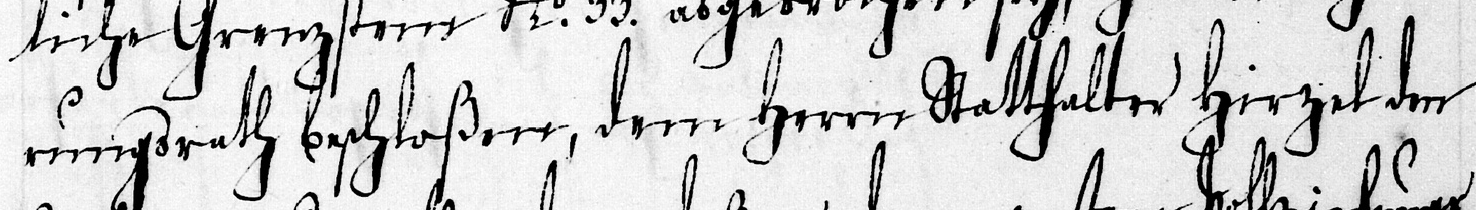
rungsrath beschloßen, dem Herrn Statthalter Hirzel den
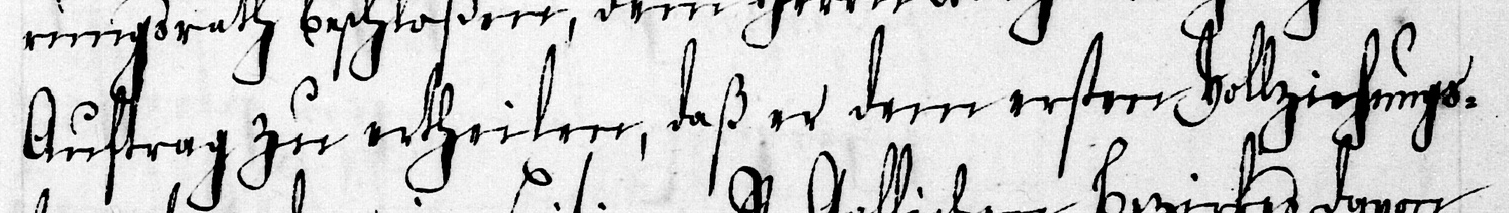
Auftrag zu ertheilen, daß er dem ersten Vollziehungs¬
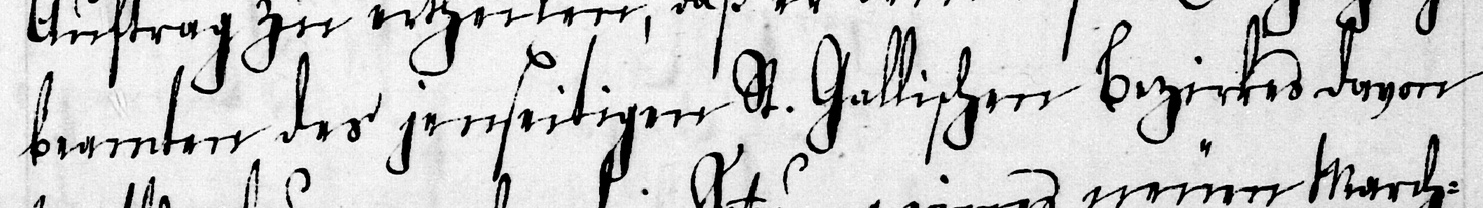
beamten des jenseitigen St. Gallischen Bezirkes davon
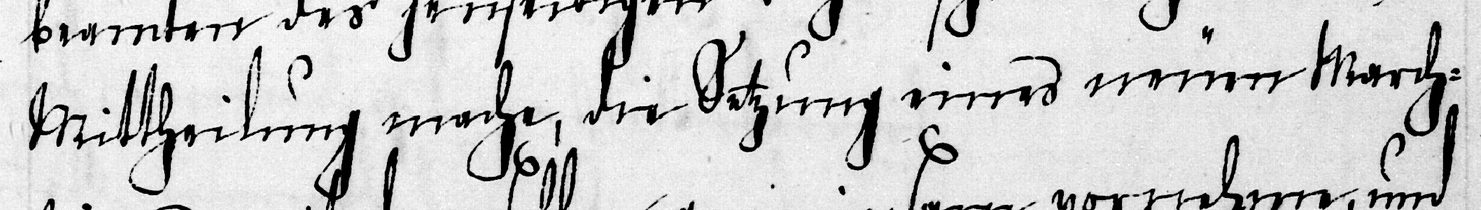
Mittheilung mache, die Setzung eines neuen March¬
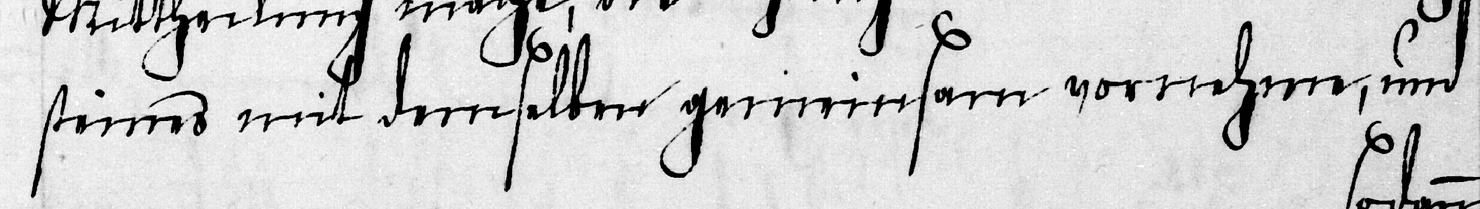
steines mit demselben gemeinsam vornehme, und
